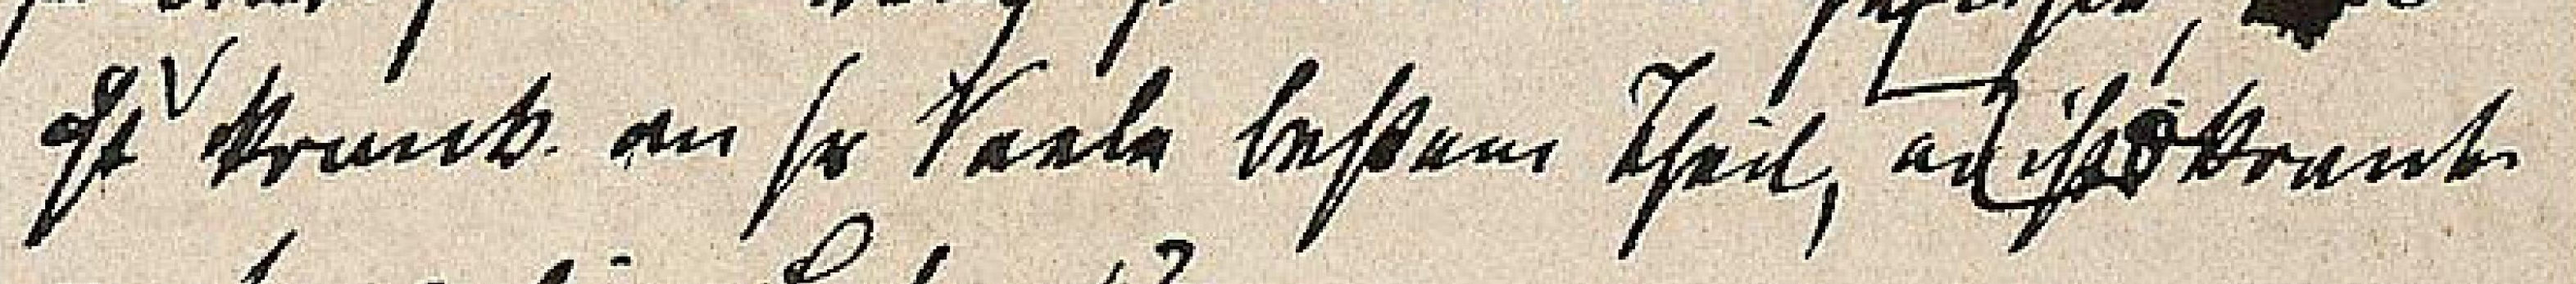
ist V krank an sr Seele besten Theil, er ist o krank
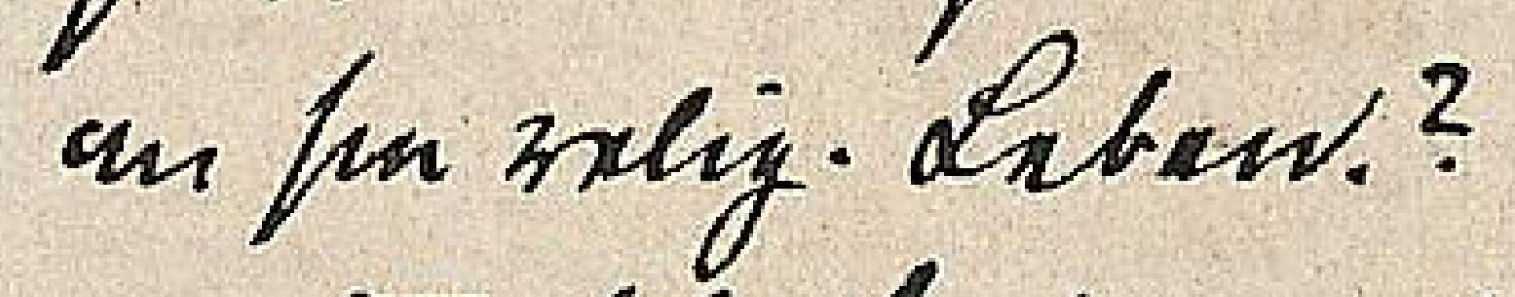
an sm relig. Leben?
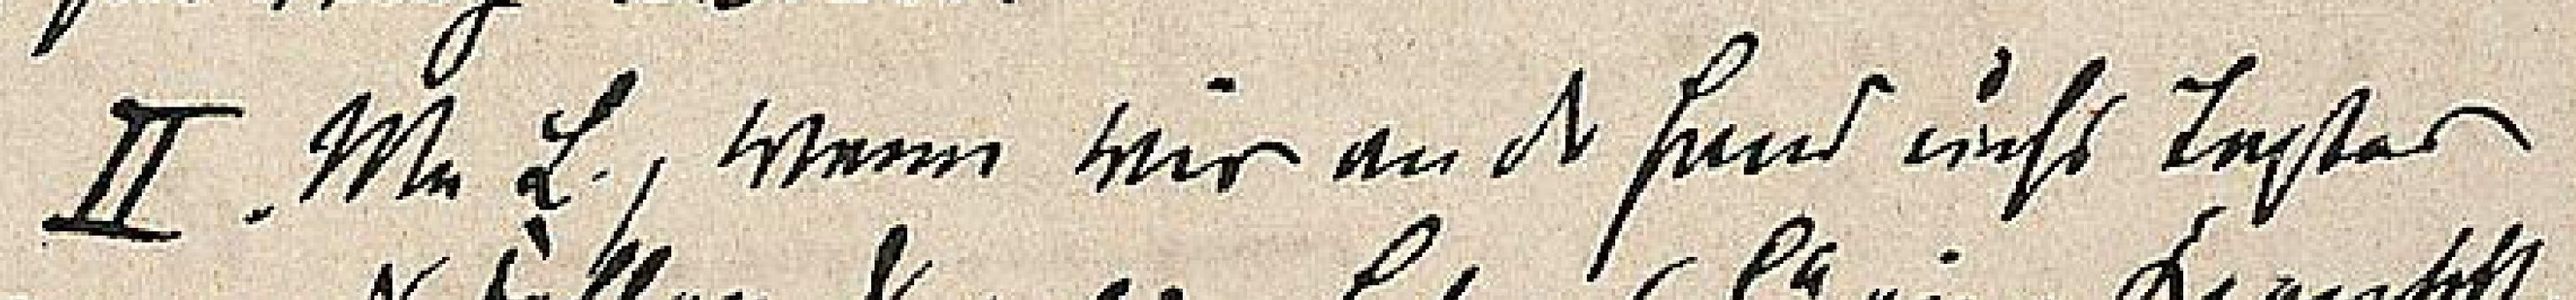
II. Mn L., wenn wir an der Hand uns Textes
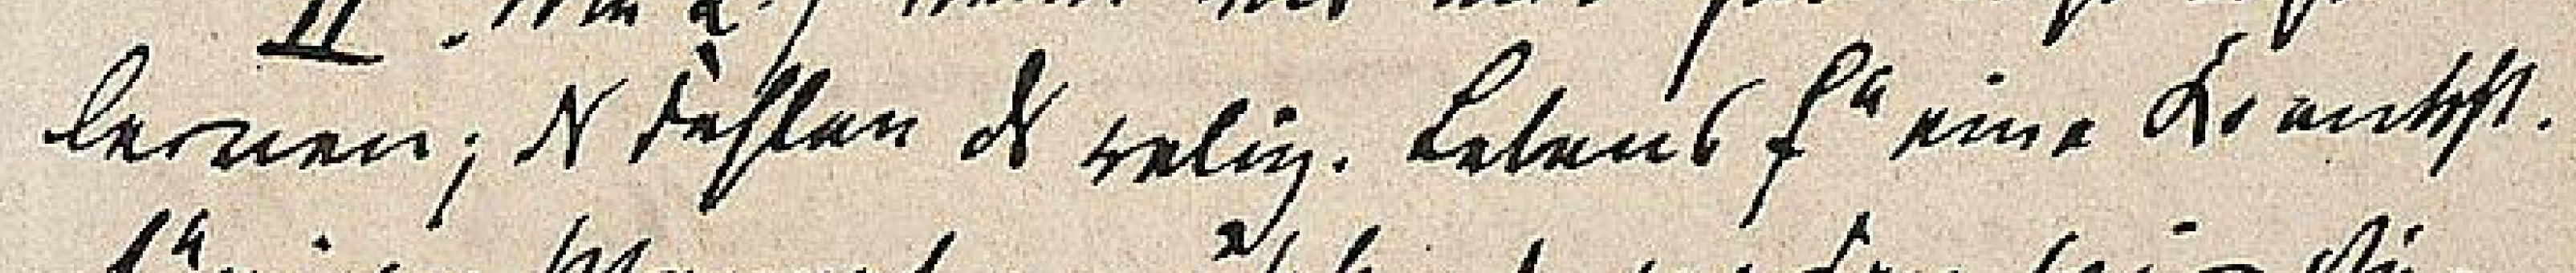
lernen, das Fehlen des relig. Lebens fü eine Krankht.
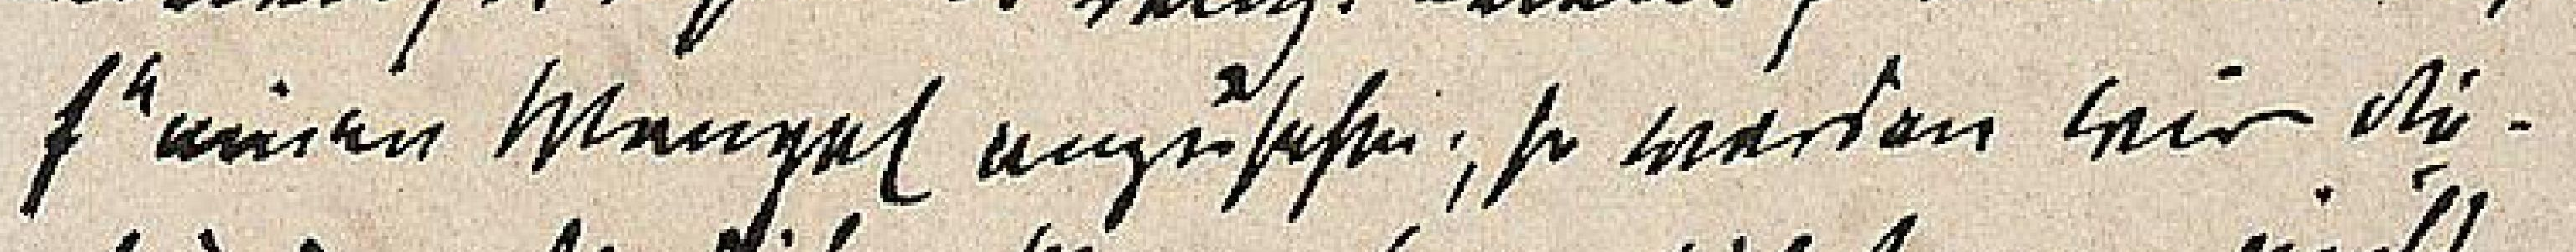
fü einen Mangel anzusehen, so werden wir, die¬
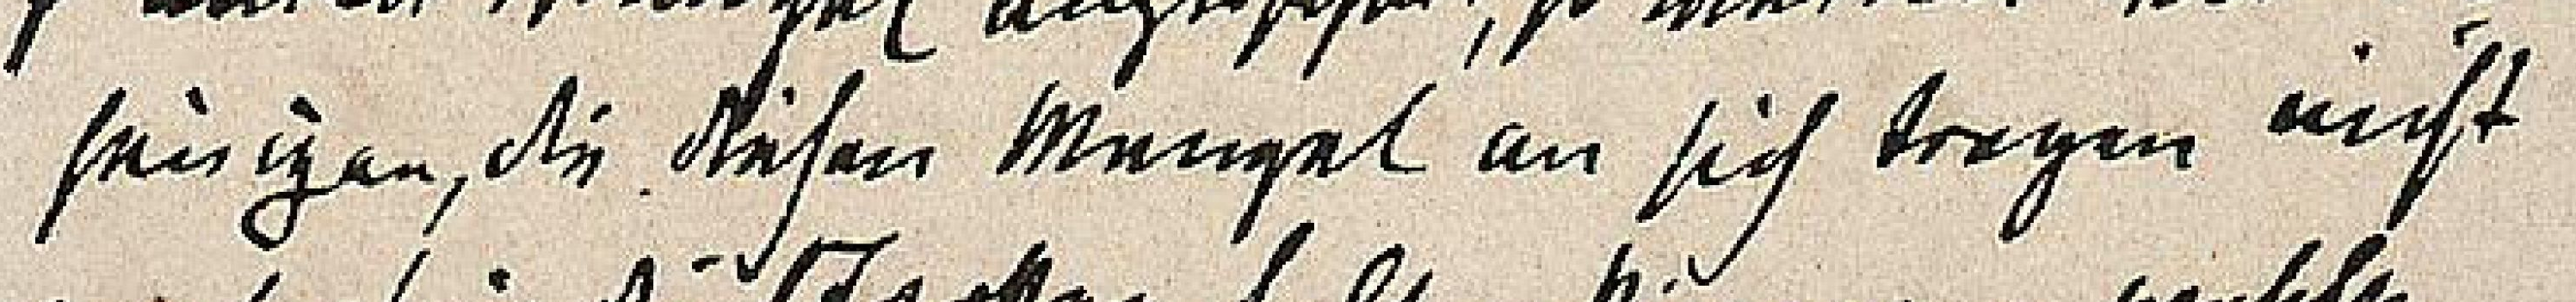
jeinigen, die diesen Mangel an sich tragen nicht
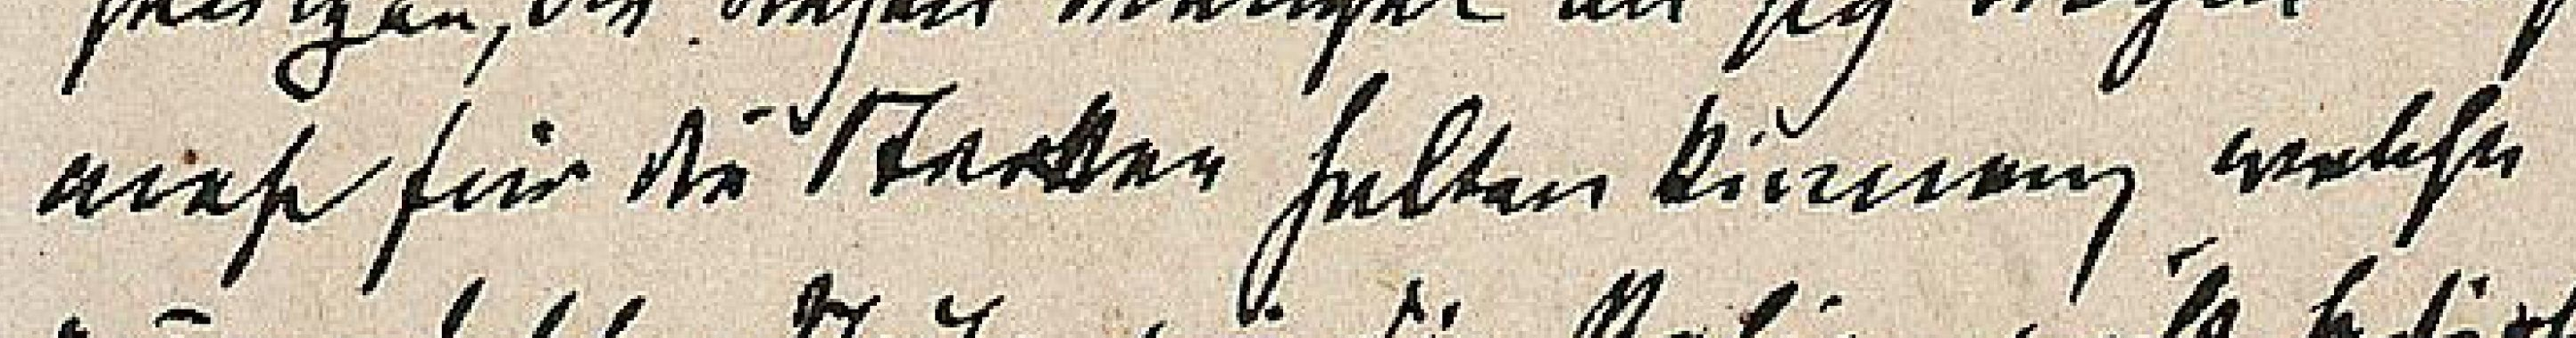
mehr für die Starken halten können, welche
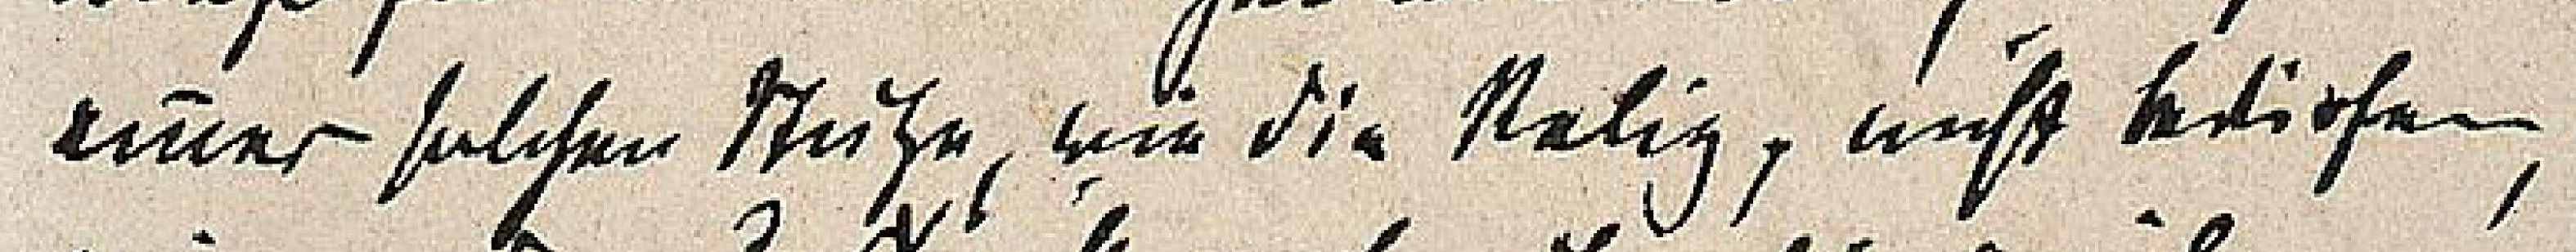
einer solchen Stütze, wie die Relig, nicht bedürfen,
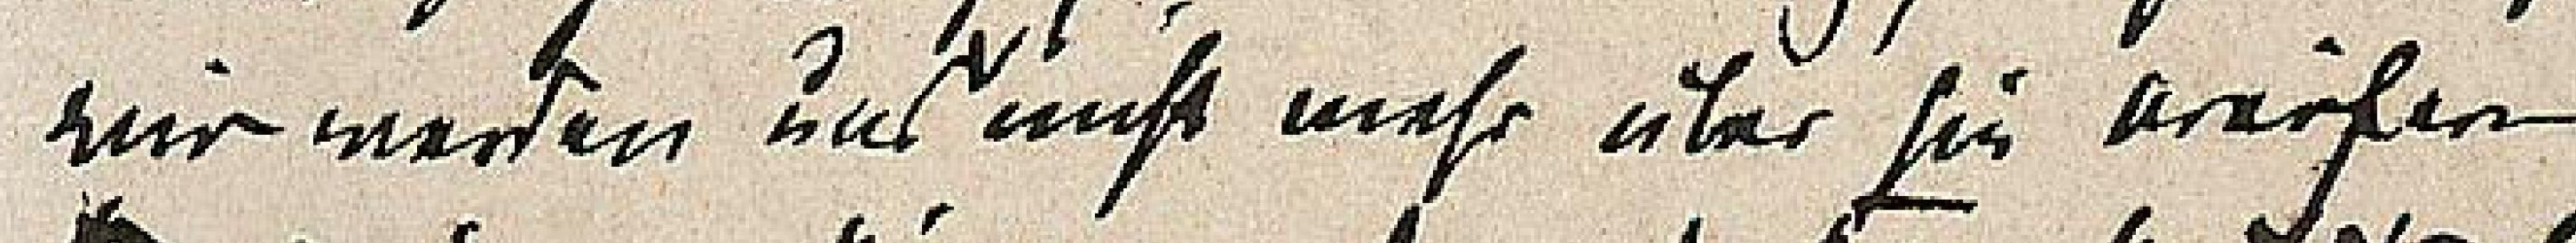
wir werden uns nicht mehr über sie ereifern
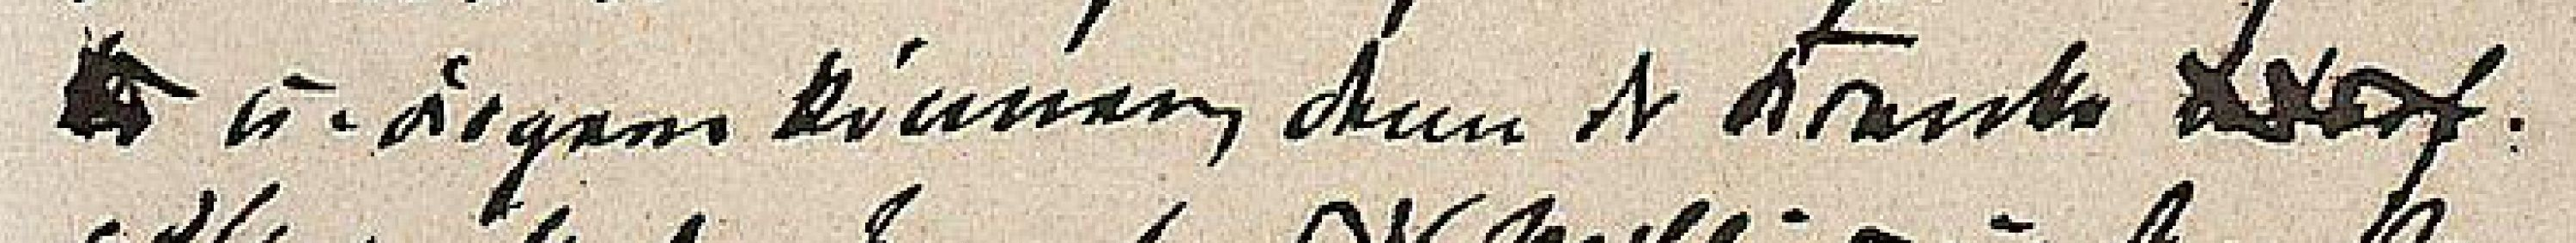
k. u. ärgern können, denn dr Kranke bedarf.
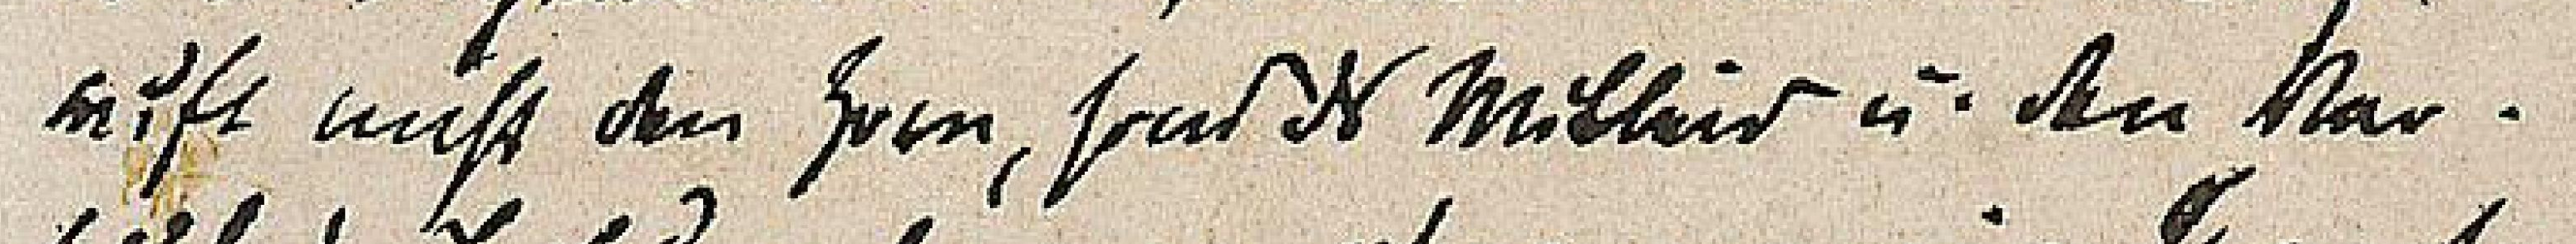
ruft nicht den Zorn, sond. ds Mitleid u. den Ver¬
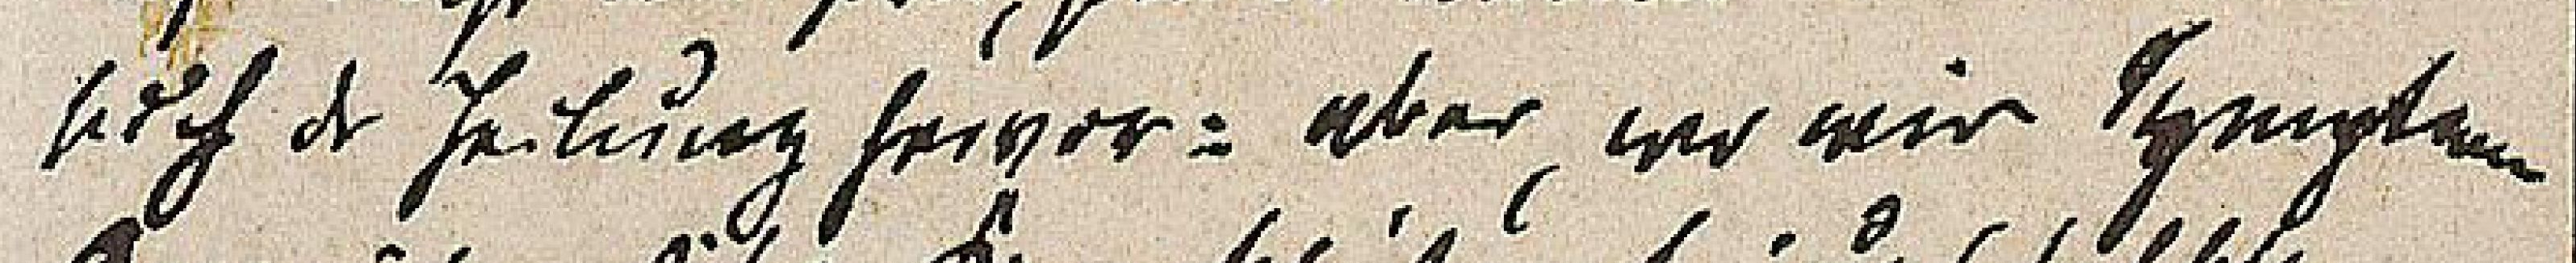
such der Heilung hervor: aber, wo wir Symptome,
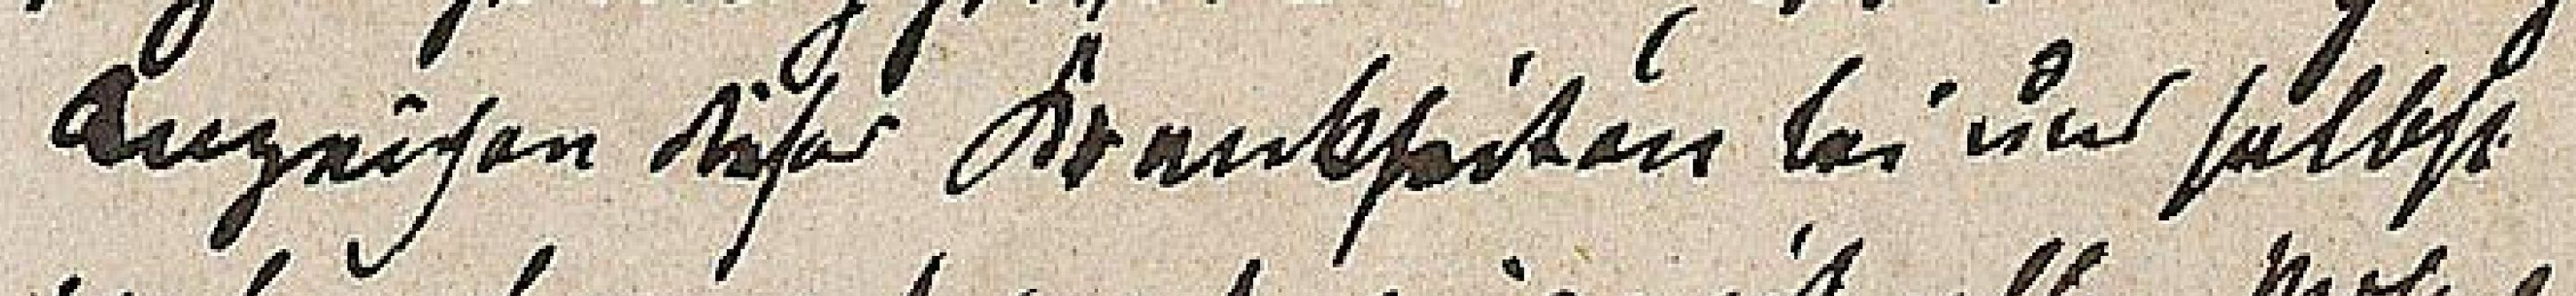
Anzeichen dieser Krankheiten bei uns selbst
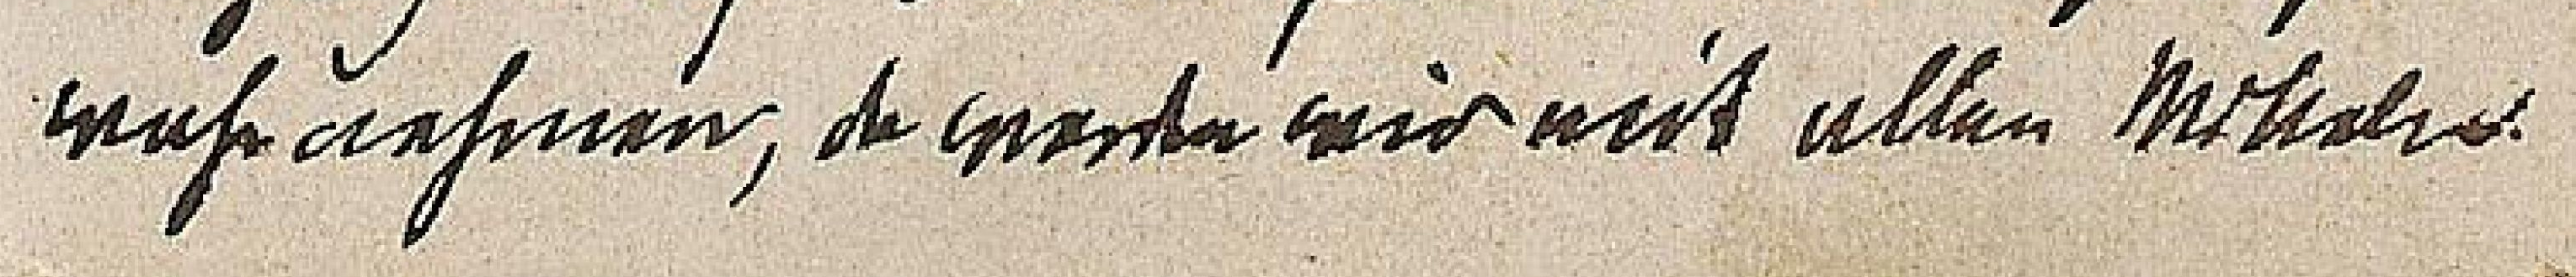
wahrnehmen, da werden wir mit allen Mittel
